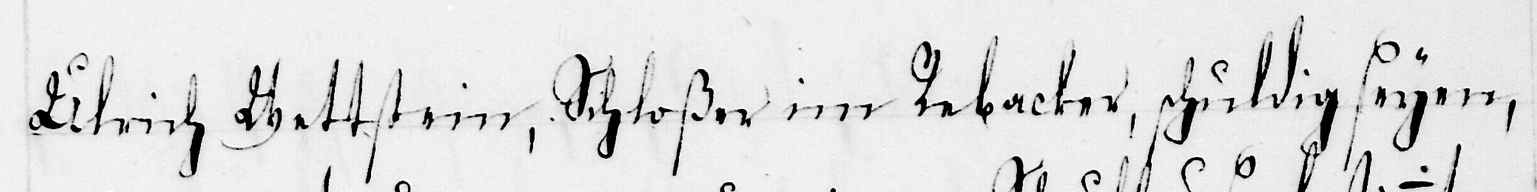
Ulrich Wettstein, Schloßer im Rebacker, schuldig seyen,
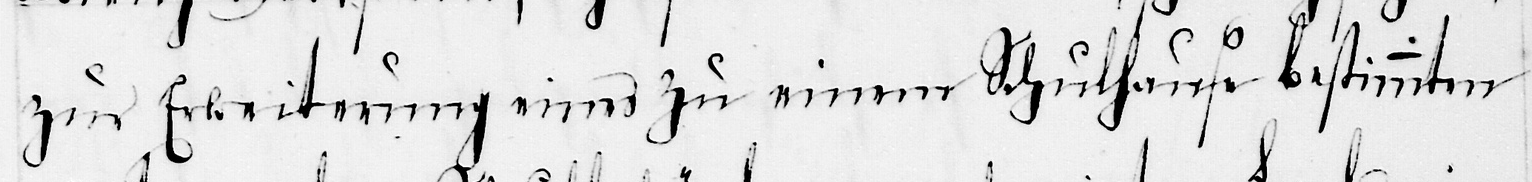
zur Erweiterung eines zu einem Schulhause bestimmten
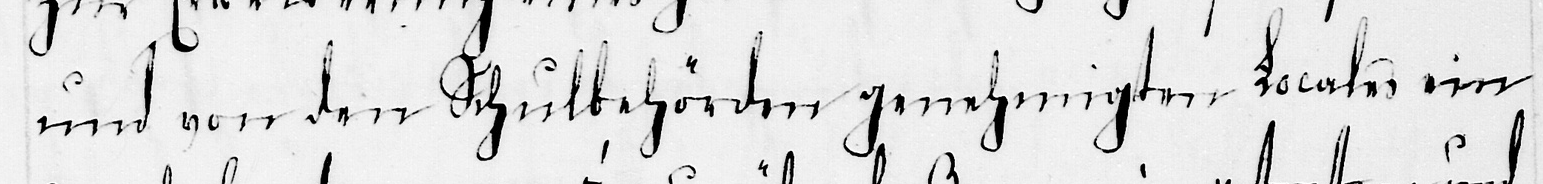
und von den Schulbehörden genehmigten Locales ein
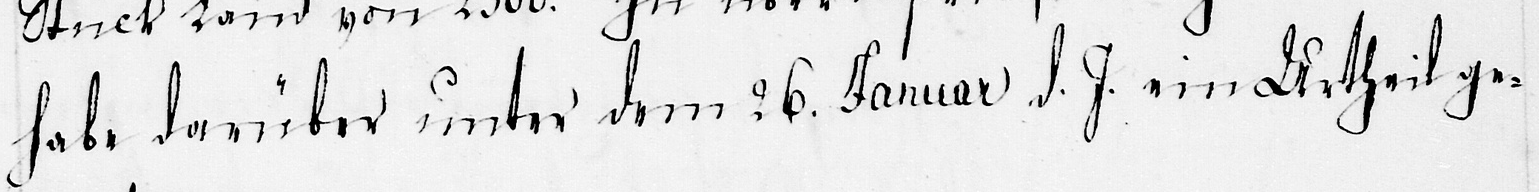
habe darüber unter dem 26. Januar d. J. ein Urtheil ge¬
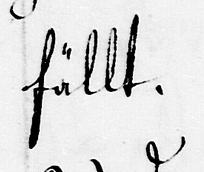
fällt.
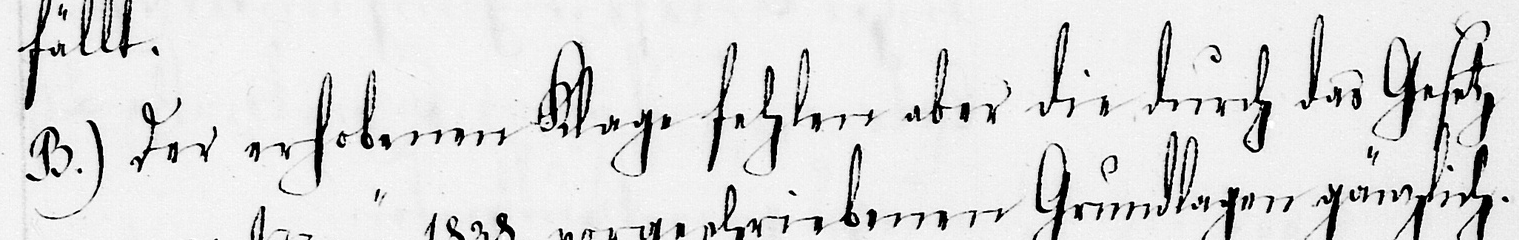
B.) Der erhobenen Klage fehlen aber die durch das Gesetz
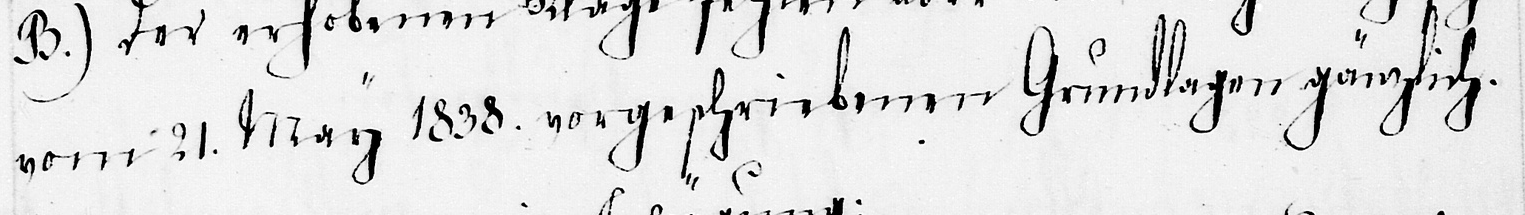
vom 21. März 1838. vorgeschriebenen Grundlagen gänzlich.
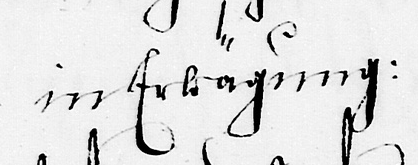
in Erwägung:
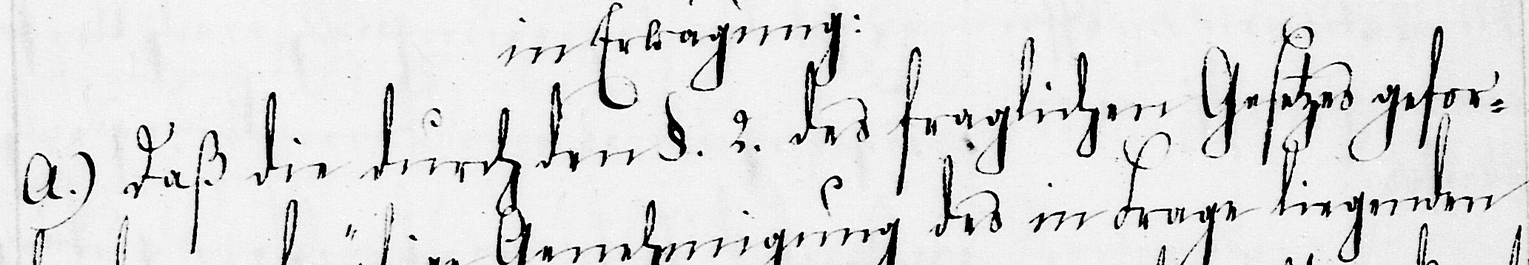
A.) Daß die durch den §. 2. des fraglichen Gesetzes gefo¬
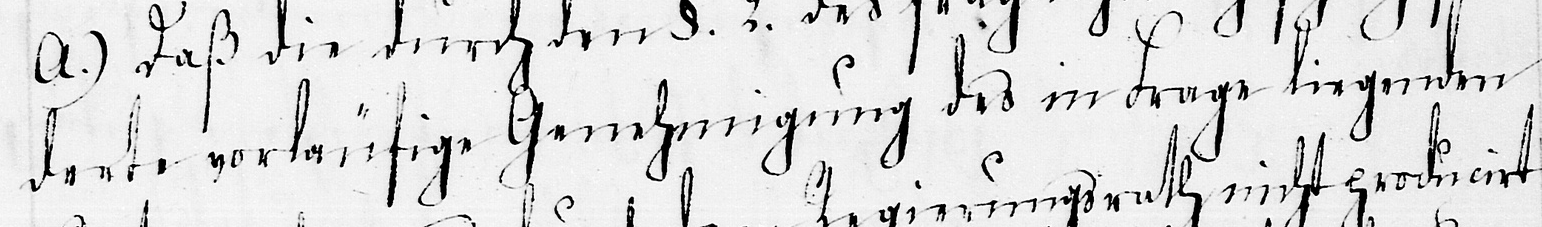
rderte vorläufige Genehmigung des in Frage liegenden
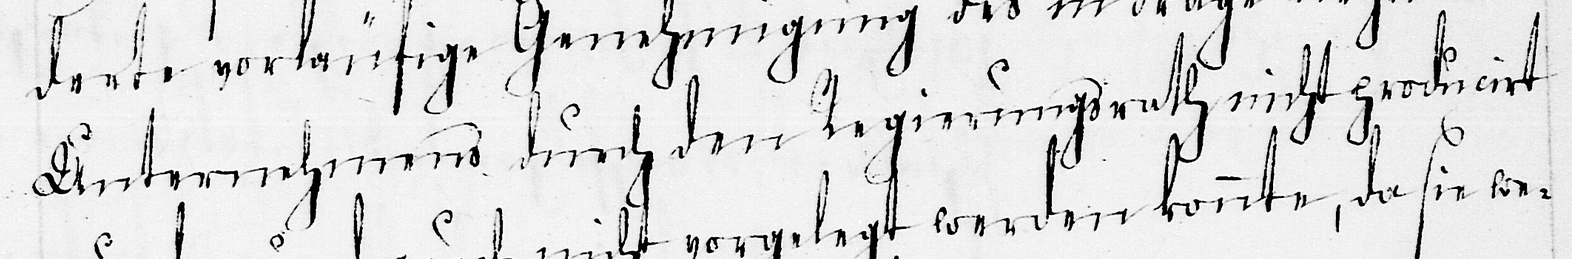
Unternehmens durch den Regierungsrath nicht producirt
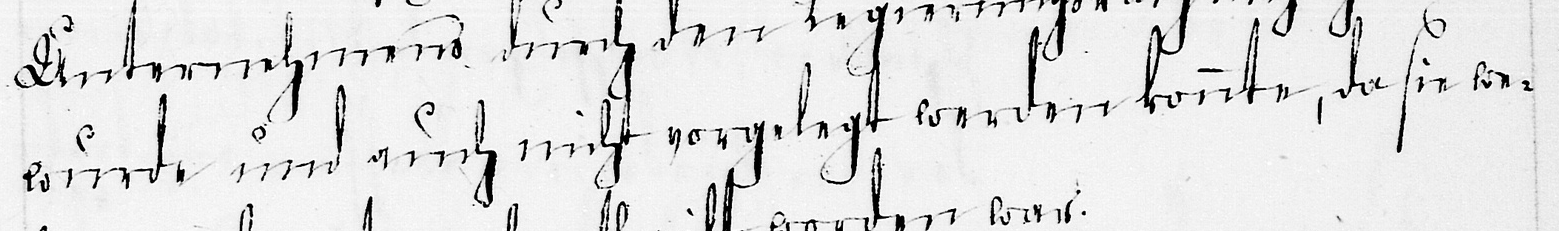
wurde und auch nicht vorgelegt werden konnte, da sie we¬
